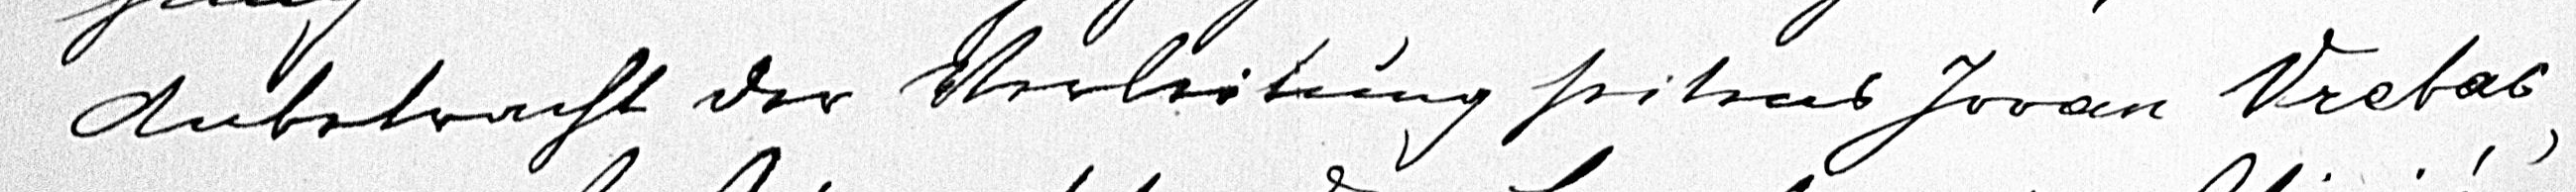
Anbetracht der Verleitung seitens Jovan Vrebac
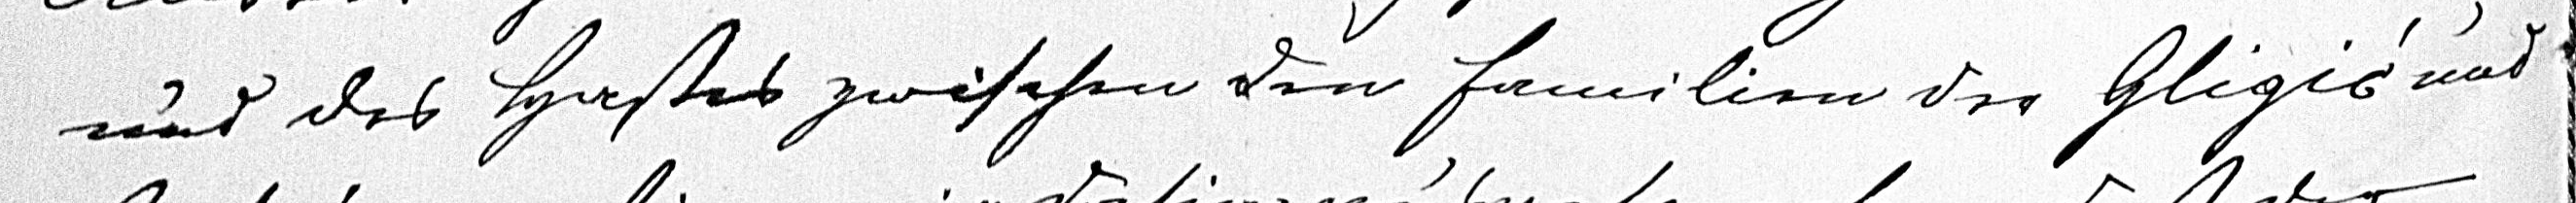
und des Haßes zwischen den Familien der Gligić und
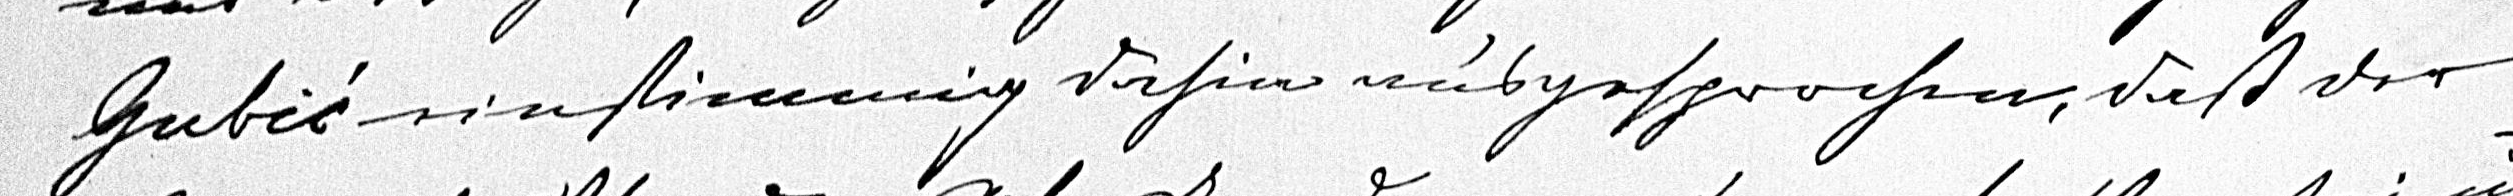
Gubić einstimmig dahin ausgesprochen, daß der
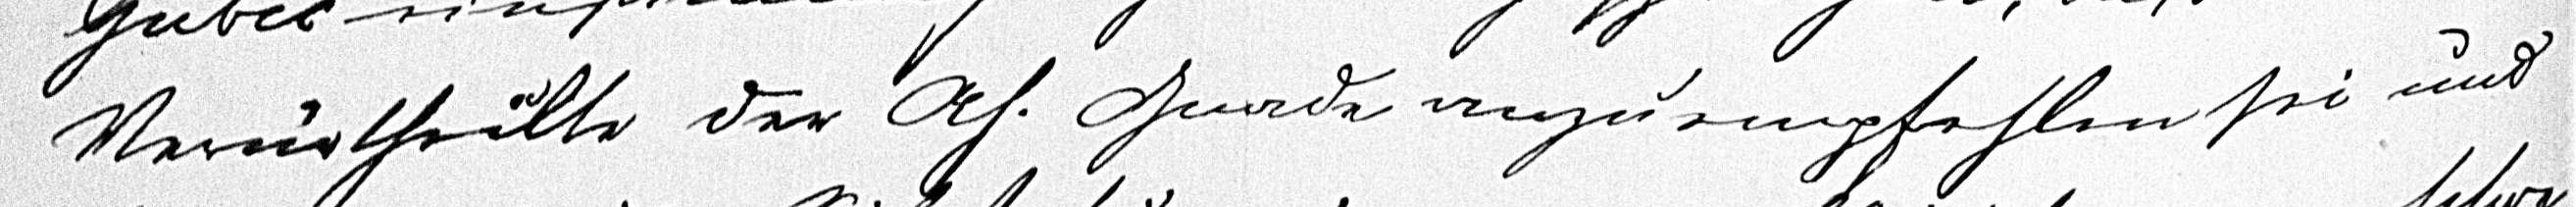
Verurtheilte der Ah. Gnade anzuempfehlen sei und
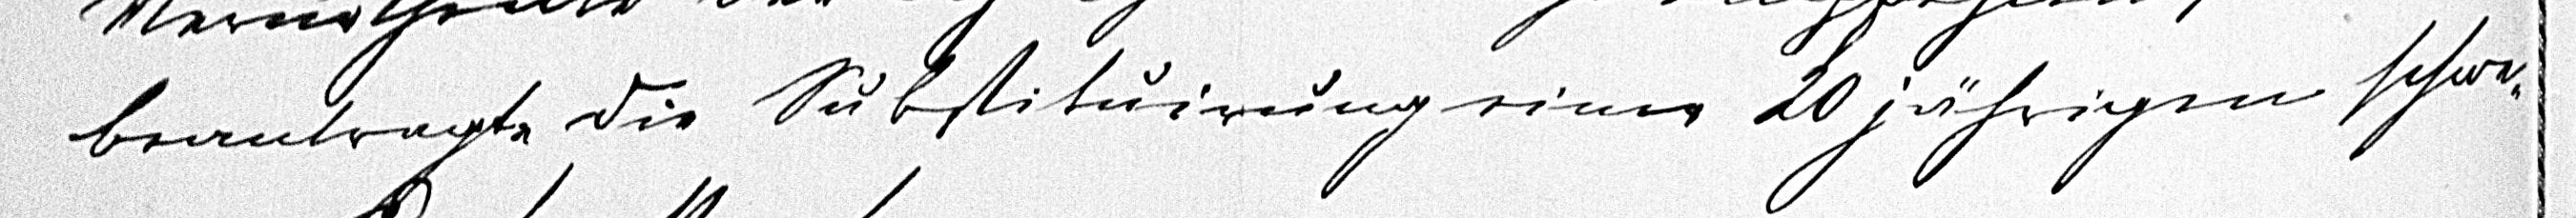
beantragte die Substituirung einer 20jährigen schwe¬
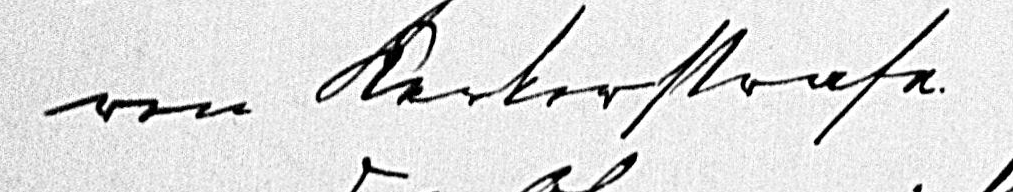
ren Kerkerstrafe.
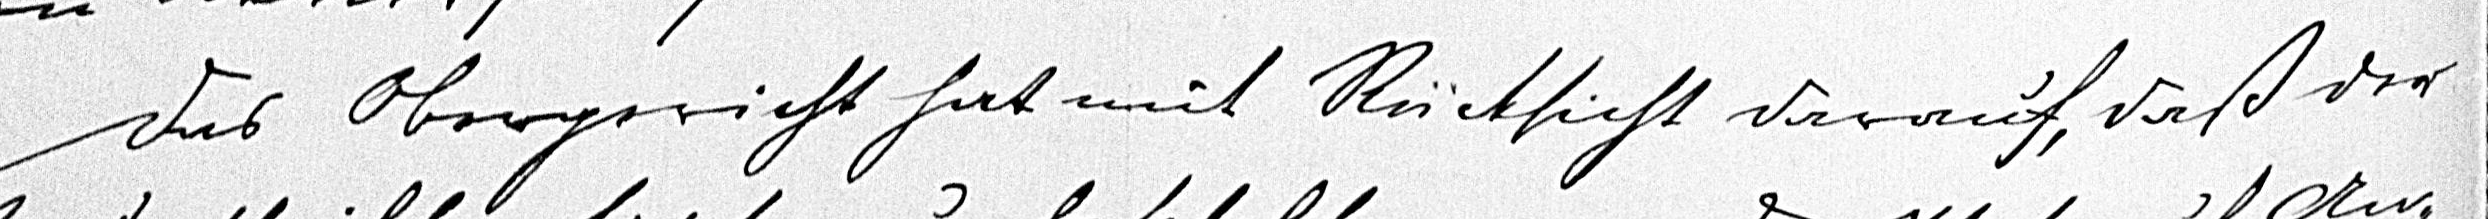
Das Obergericht hat mit Rücksicht darauf, daß der
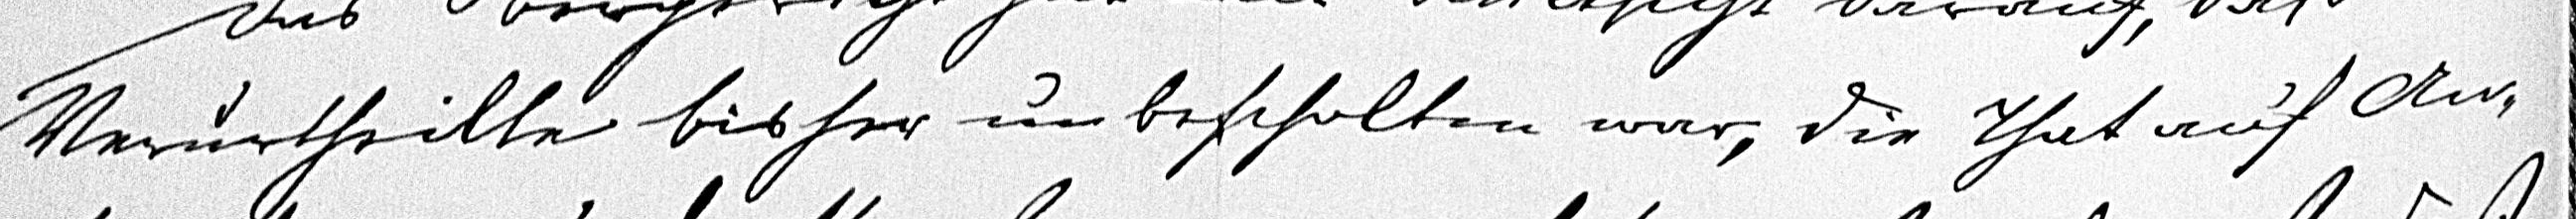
Verurtheilte bisher unbescholten war, die That auf An¬
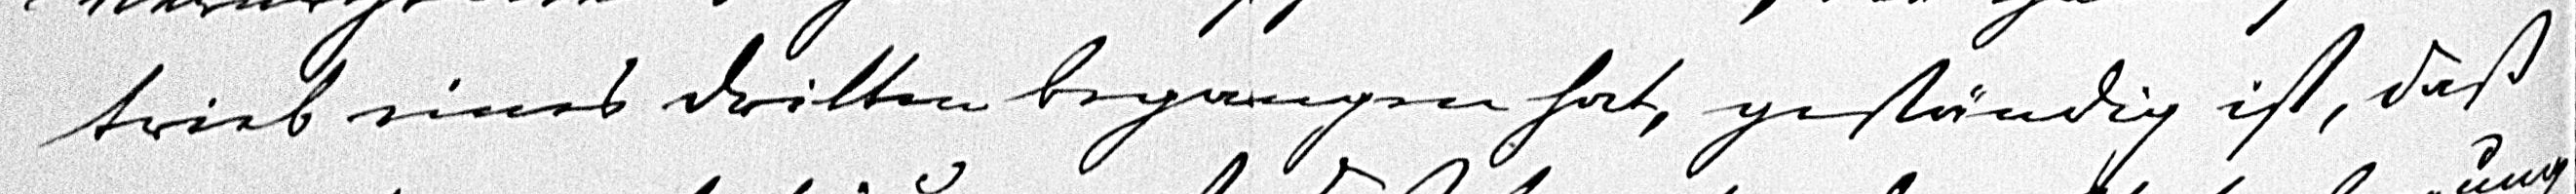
trieb eines dritten begangen hat, geständig ist, daß
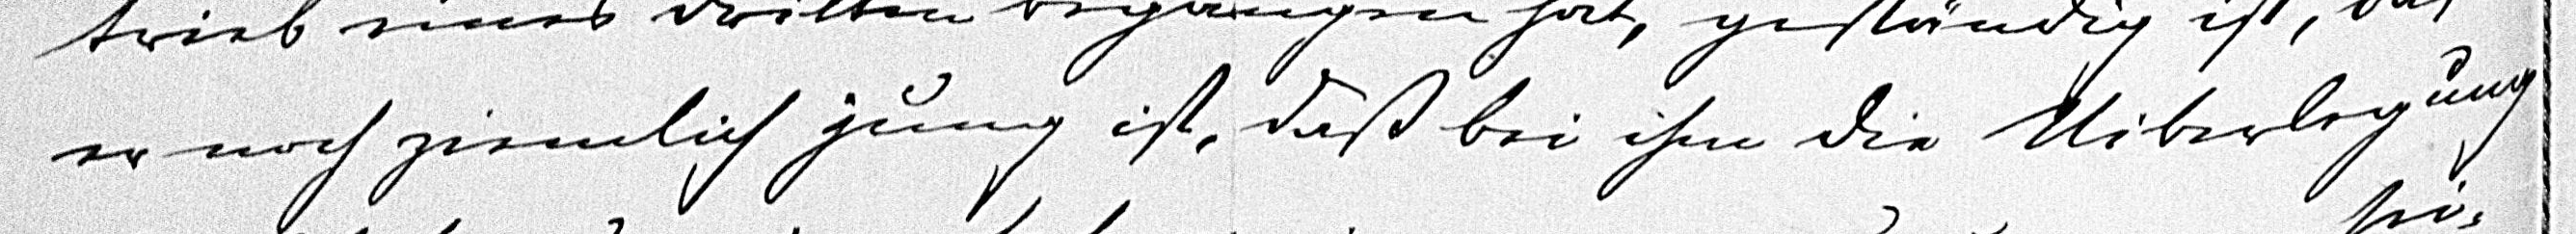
er noch ziemlich jung ist, daß bei ihm die Ueberlegung
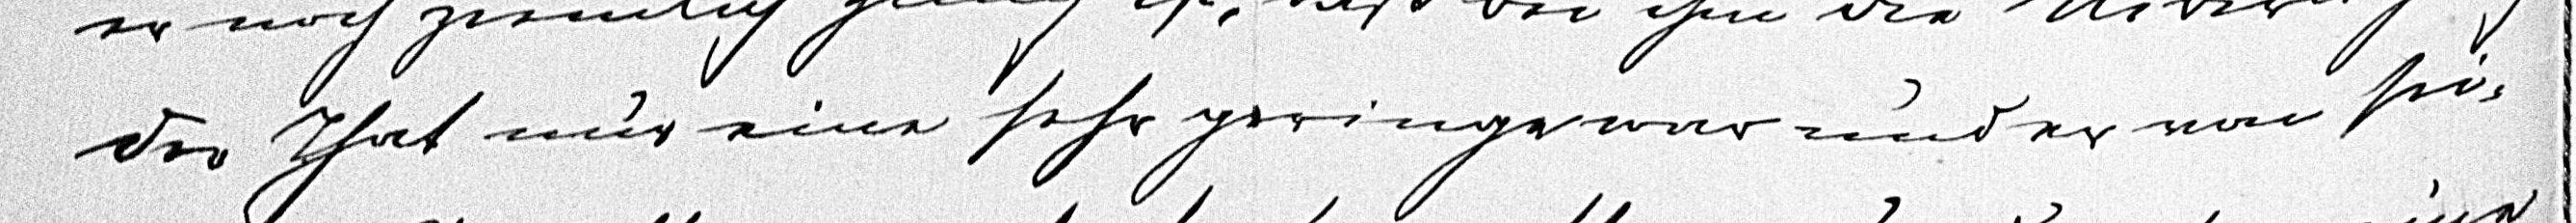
der That nur eine sehr geringe war und er von sei¬
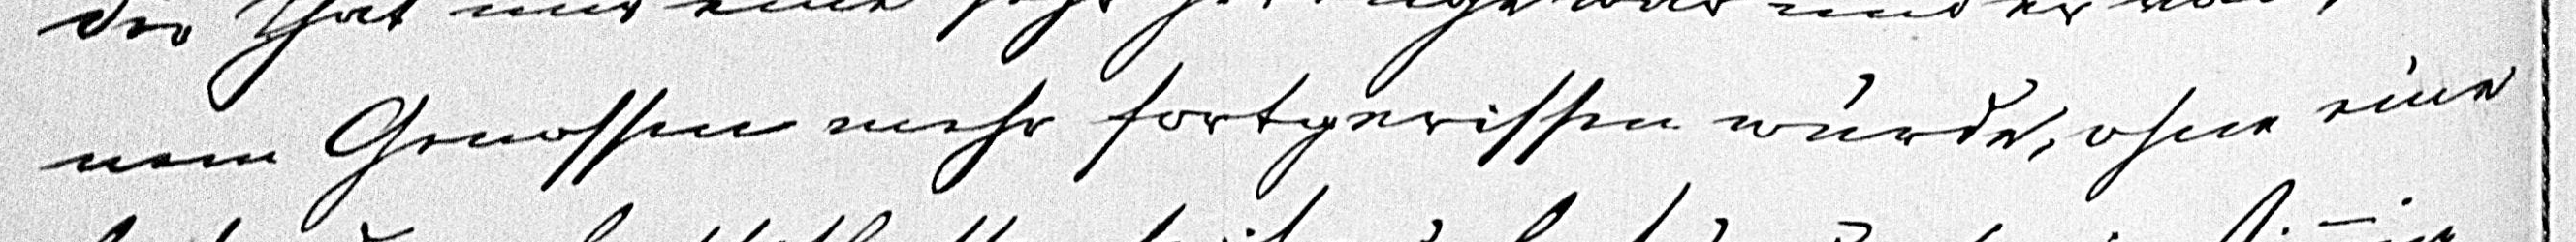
nem Genossen mehr fortgerissen wurde, ohne eine
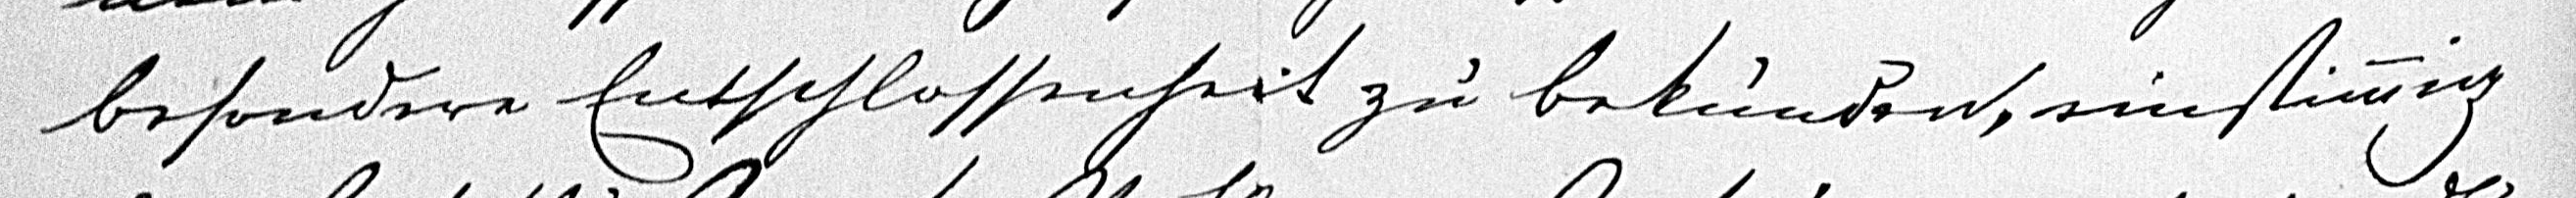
besondere Entschlossenheit zu bekunden, einstimmig
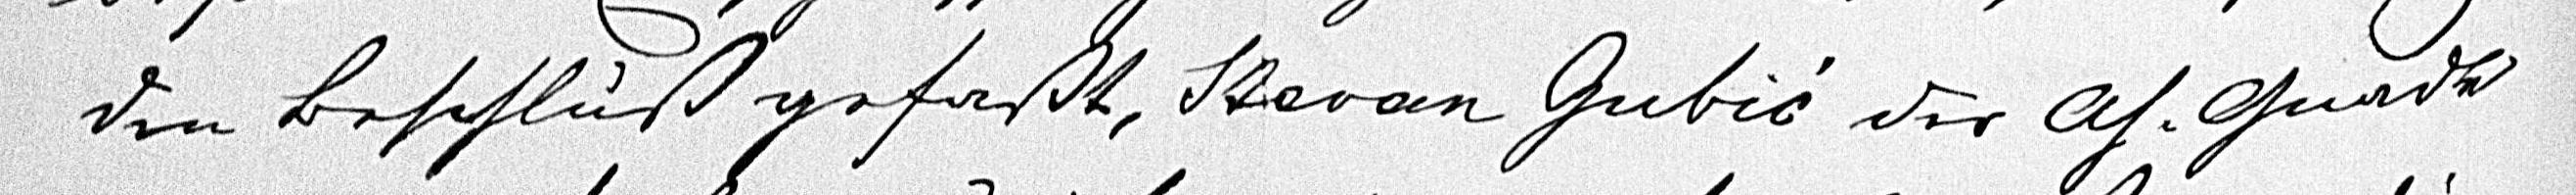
den Beschluß gefaßt, Stevan Gubić der Ah. Gnade
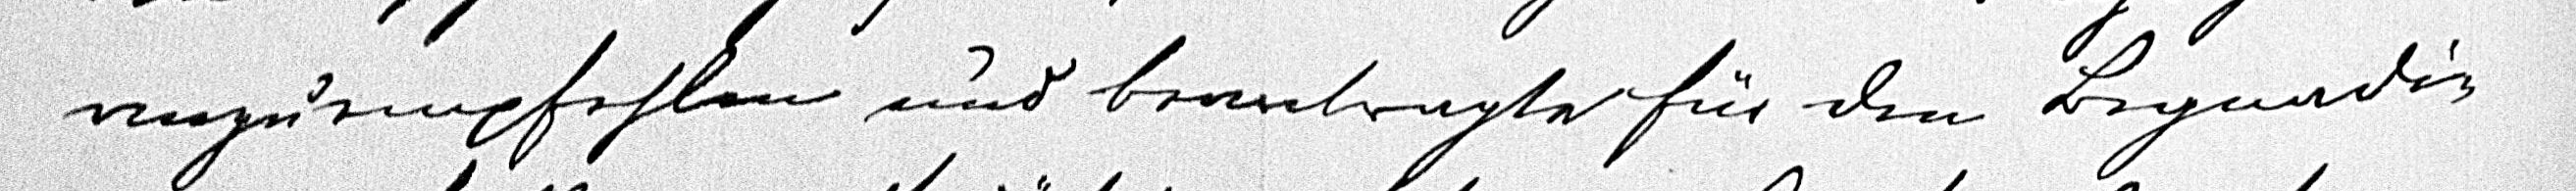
anzuempfehlen und beantragte für den begnadi¬
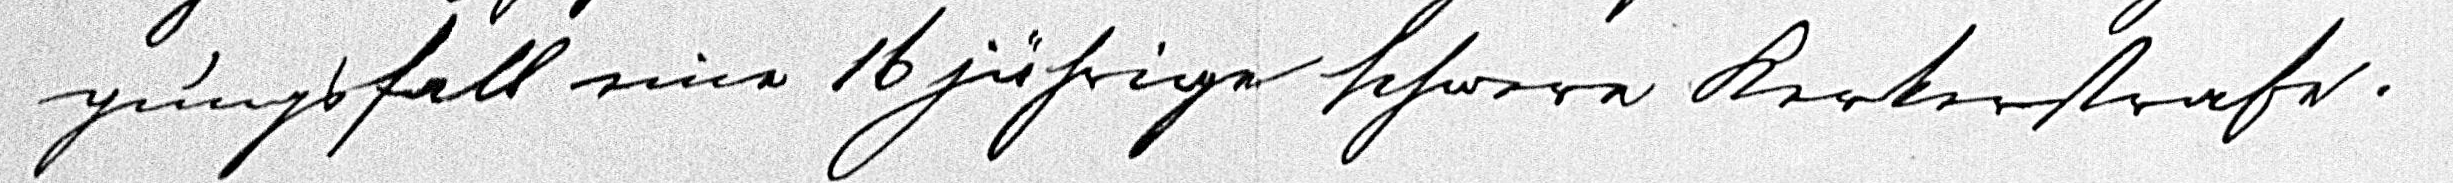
gungsfall eine 16 jährige schwere Kerkerstrafe.
